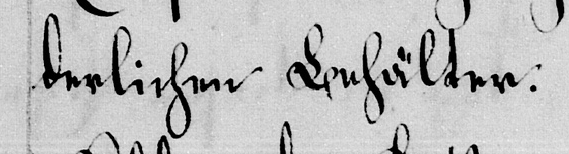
derlichen Behälter.
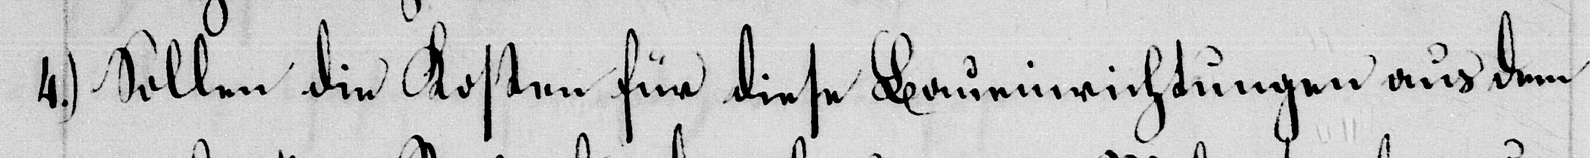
4.) Sollen die Kosten für diese Baueinrichtungen aus dem
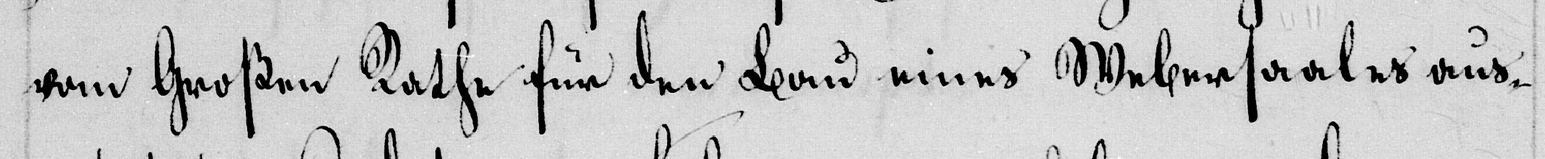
vom Großen Rathe für den Bau eines Webersaales aus¬
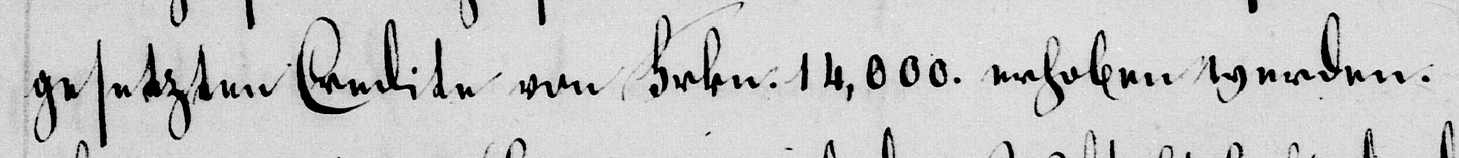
gesetzten Credite von Frkn. 14,000. erhoben werden.
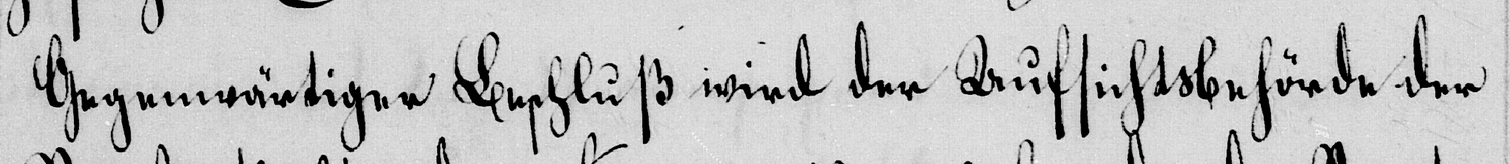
Gegenwärtiger Beschluß wird der Aufsichtsbehörde der
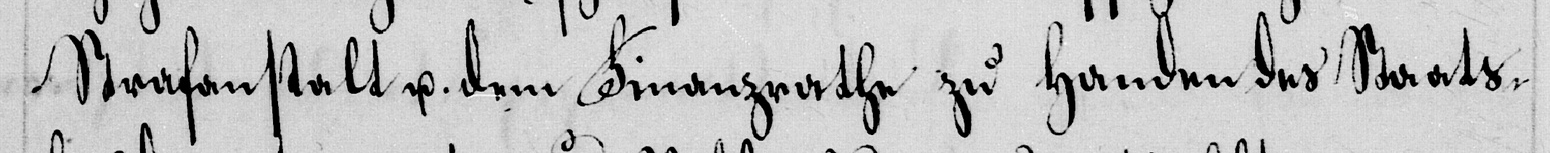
Strafanstalt u. dem Finanzrathe zu Handen des Staats¬
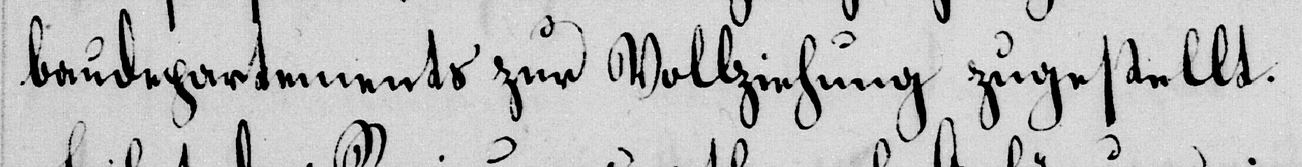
baudepartements zur Vollziehung zugestellt.
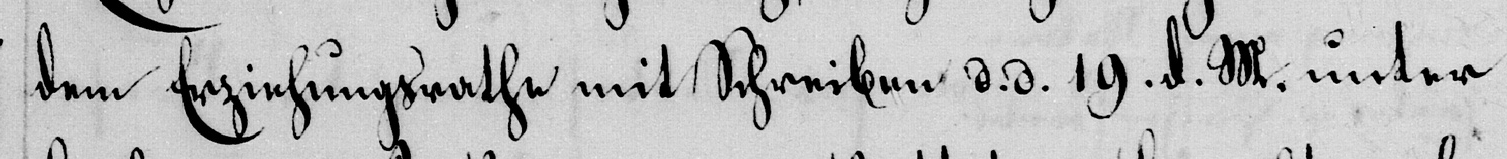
dem Erziehungsrathe mit Schreiben d. d. 19. d. M. unter
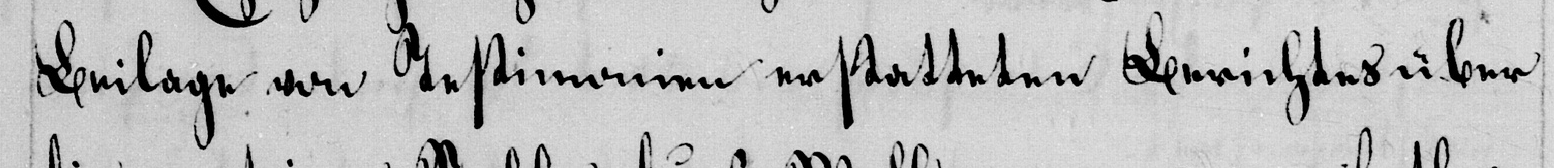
Beilage von Testimonien erstatteten Berichtes über
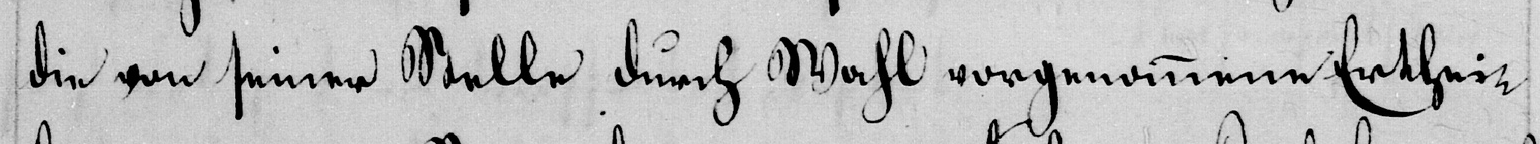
die von seiner Stelle durch Wahl vrogenommenen Erthei¬
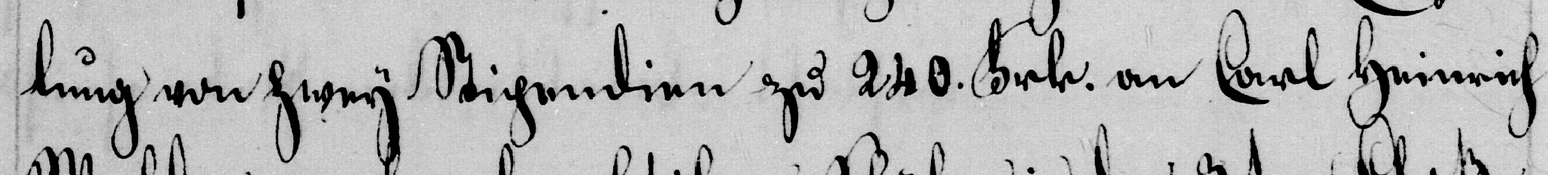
lung von zwey Stipendien zu 240. Frk. an Carl Heinrich
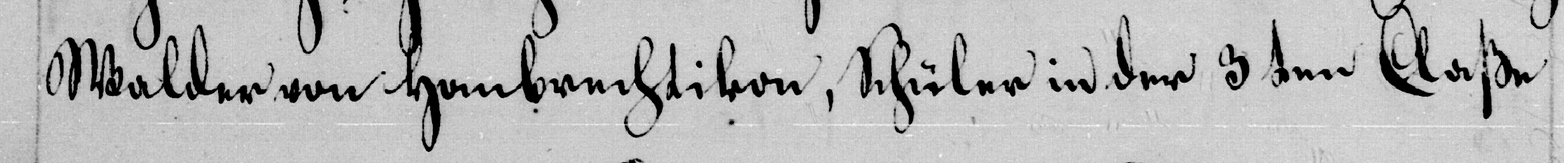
Walder von Hombrechtikon, Schüler der 3ten Claße
